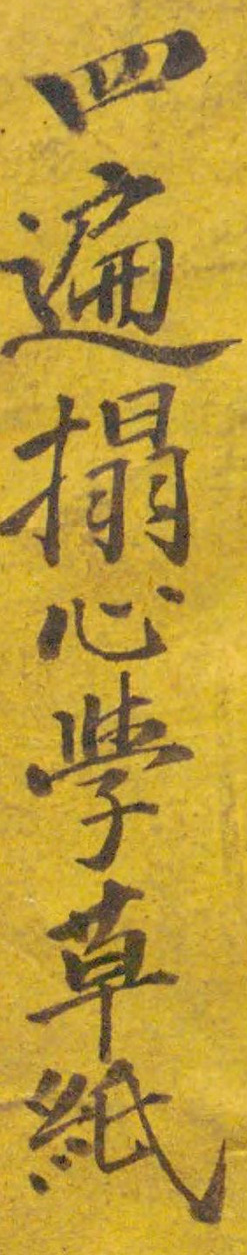四遍摺心学草紙

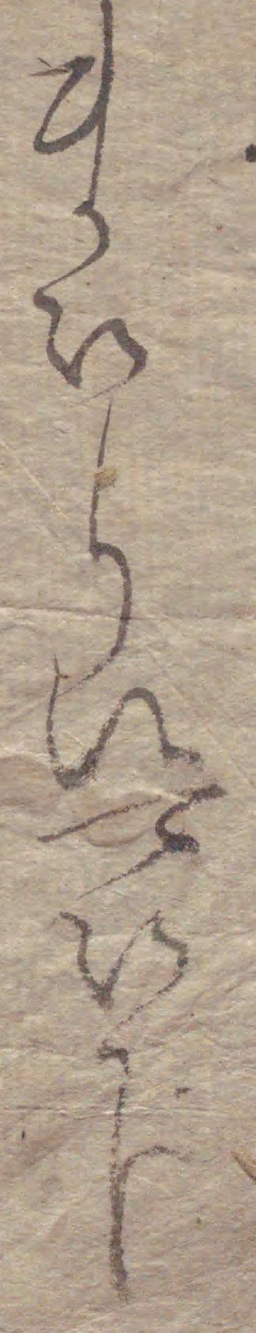まいり候可被下
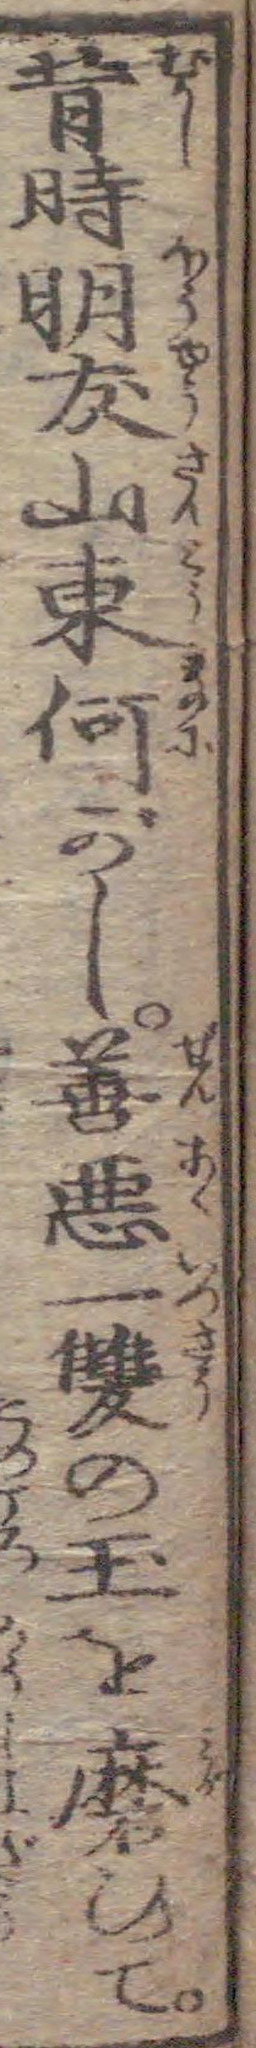昔時朋友山東何がし。善悪一双の玉を磨ひて。
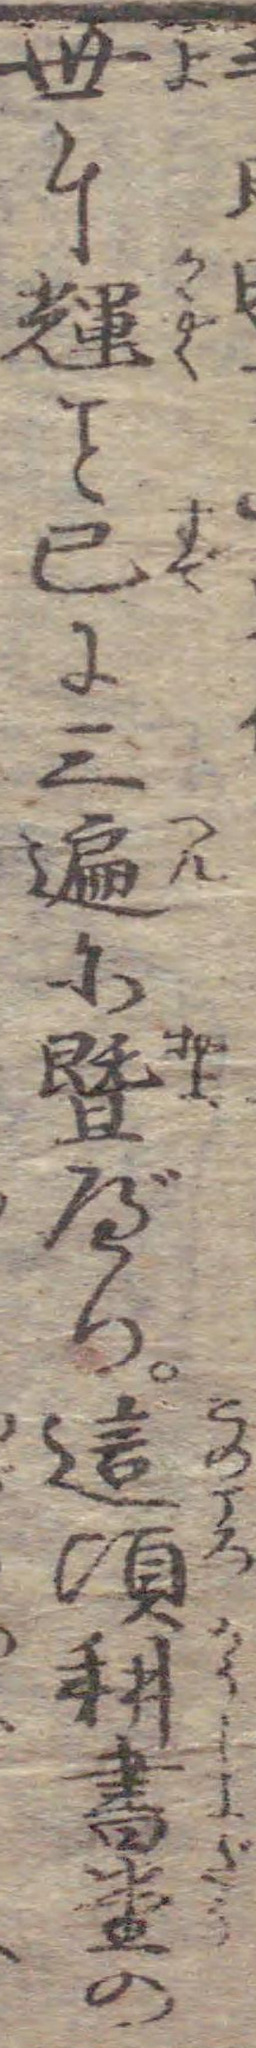世に輝こと已に三遍に曁べり。這頃耕書堂の
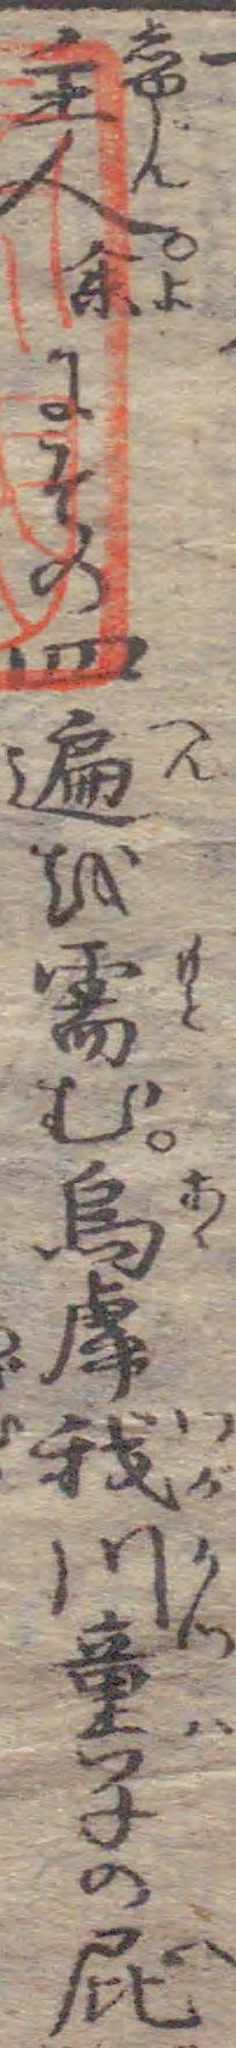主人。余にその四遍を需む。烏虎我川童子の屁
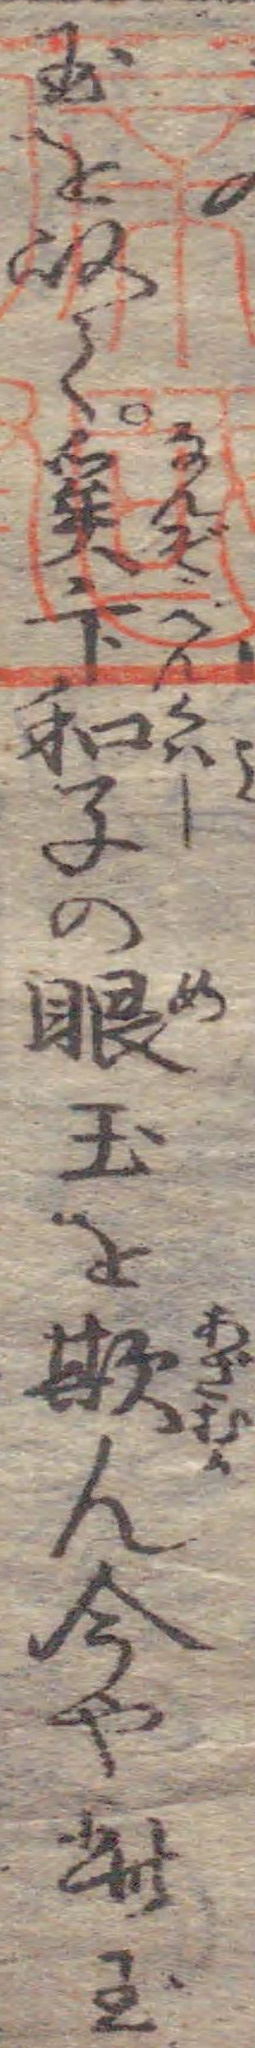玉を以て。奚卞和子の眼玉を欺ん今や此玉
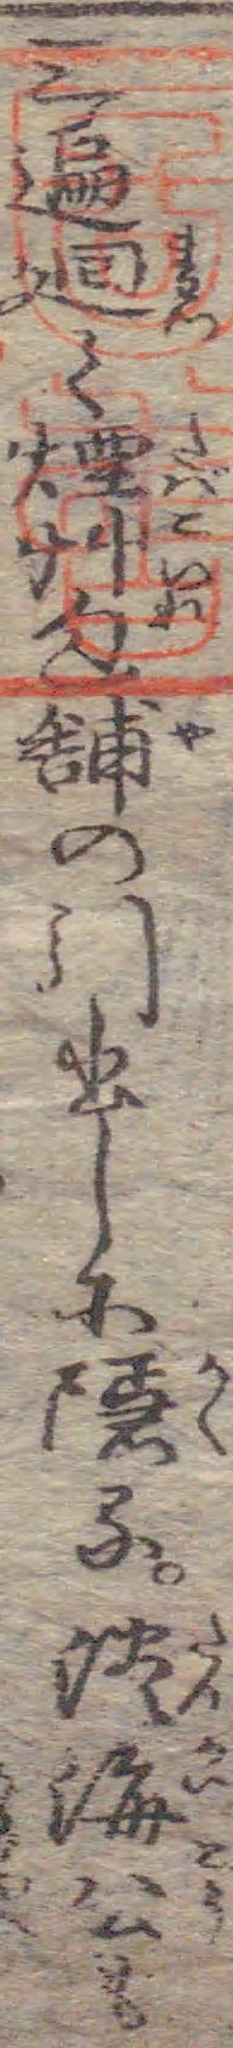三遍廻て煙艸包舗の引出しに隠る。淡海公も
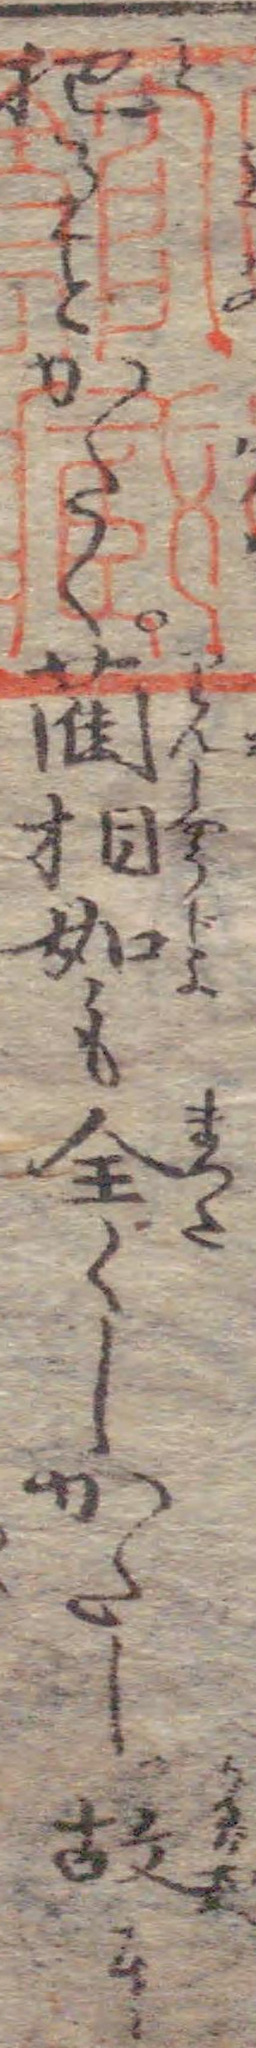把ることかたく。藺相如も全くしかたし。故に
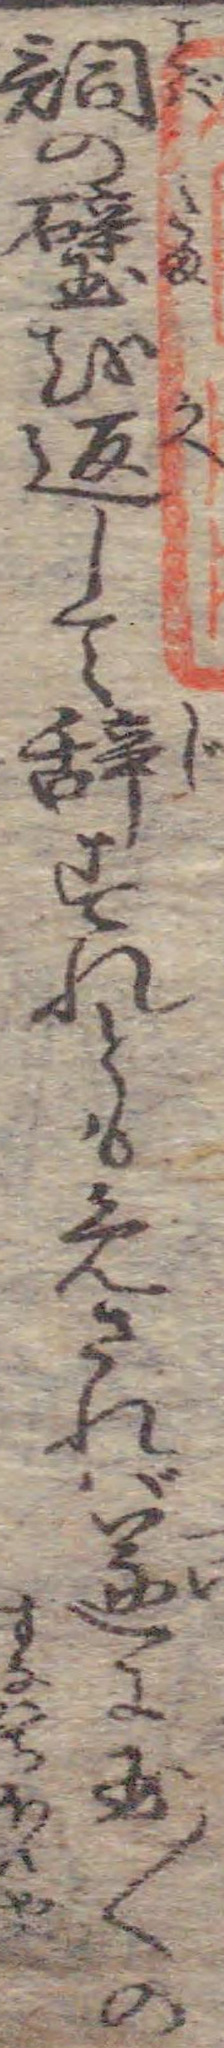詞の璧を返して辞すれとも免されば遂に玉〳〵の
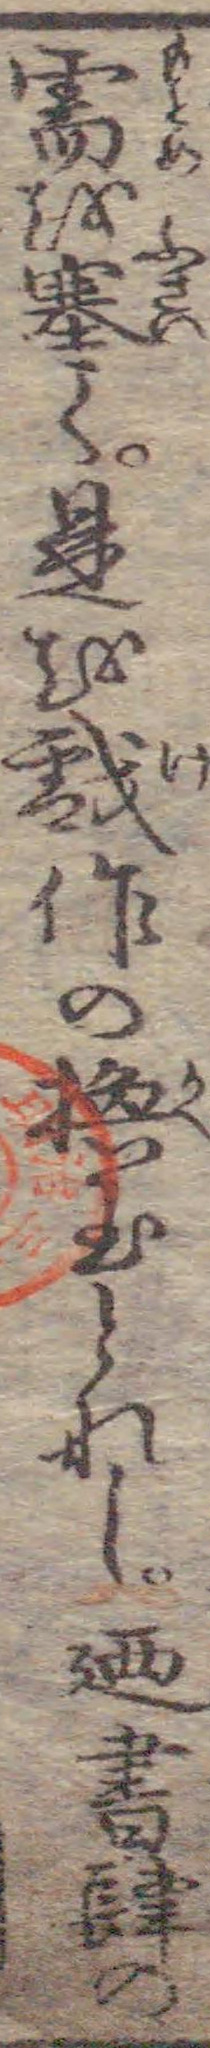需を塞て。是を戯作の換玉となし。廼書肆の

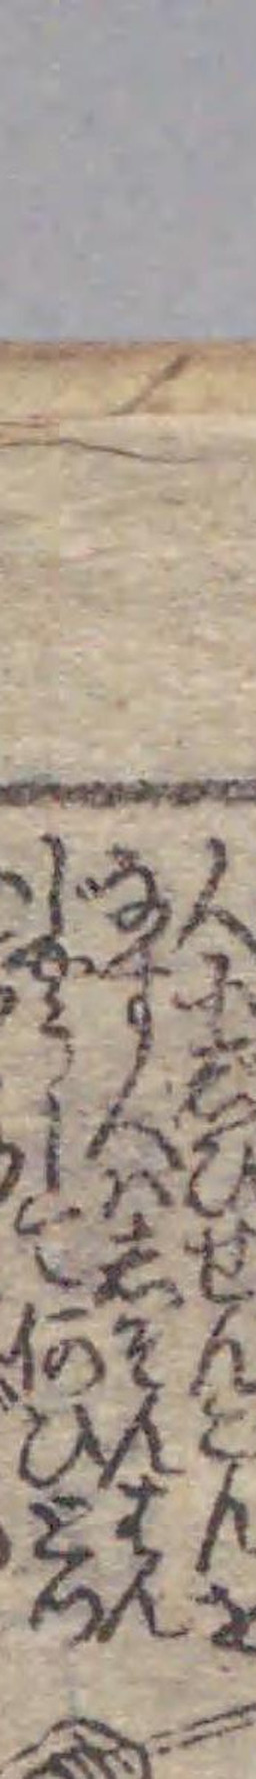なす人はしそんはん
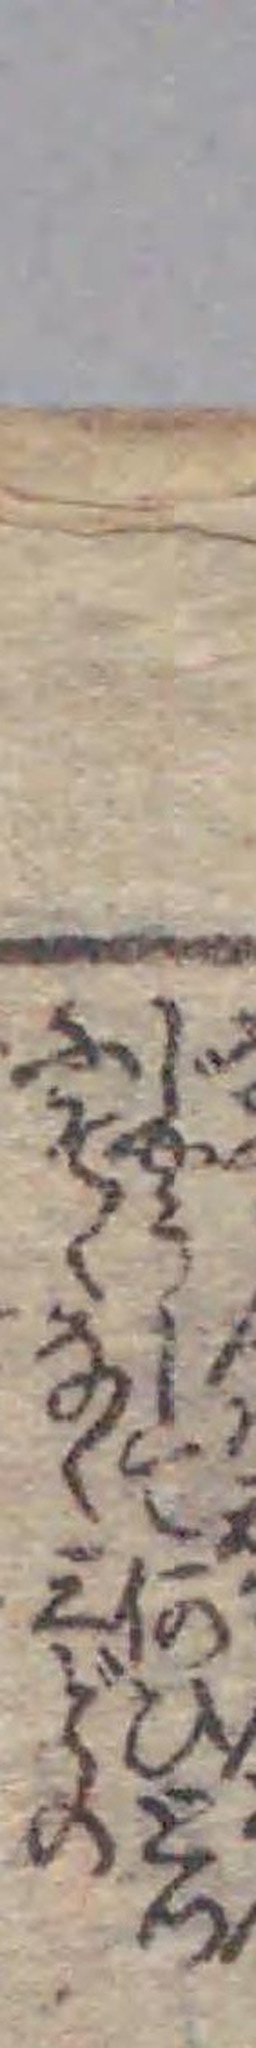ふそくなく三どの
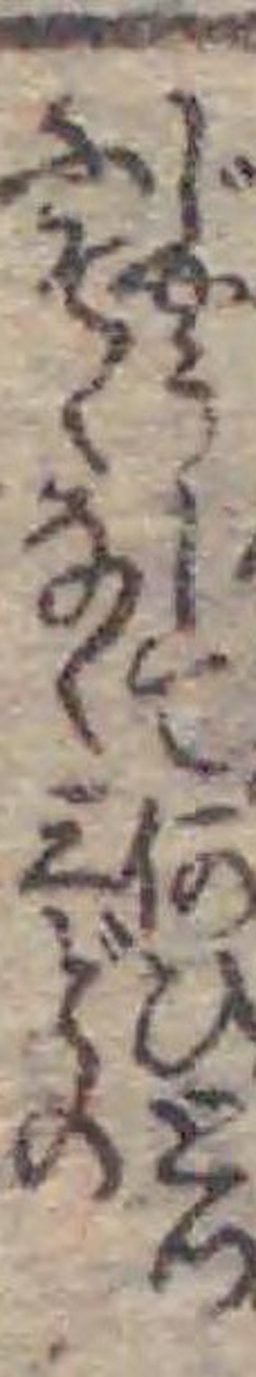ふそくなく三どの
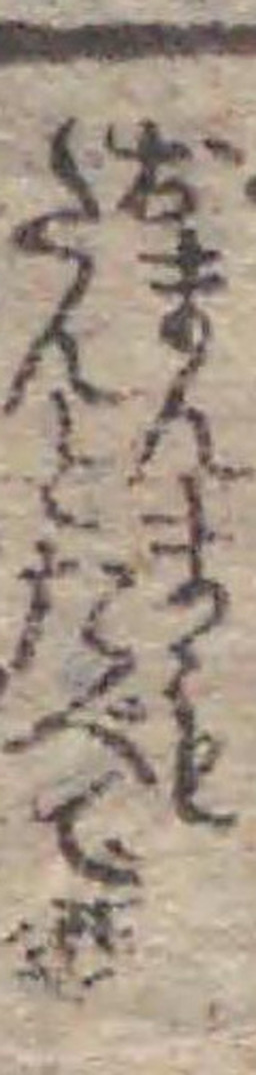たんとたべて
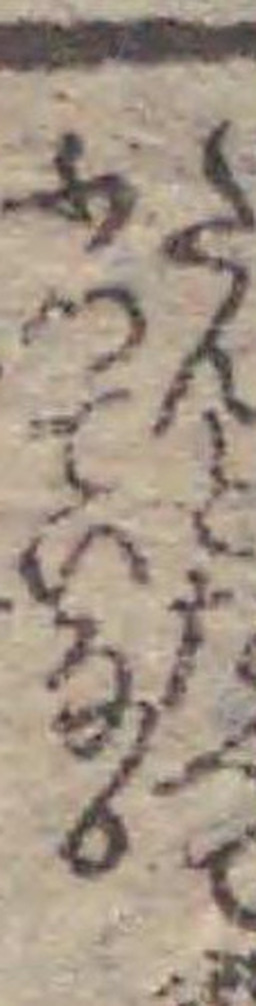ふつていなる
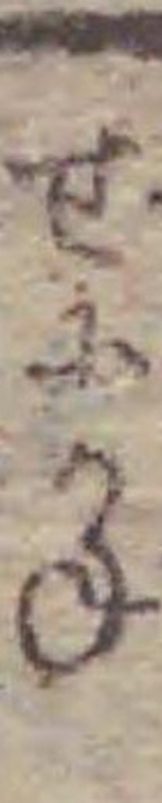せにかね
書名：四遍搨心学草帋 : 3巻
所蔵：国立国会図書館 National Diet Library, JAPAN
